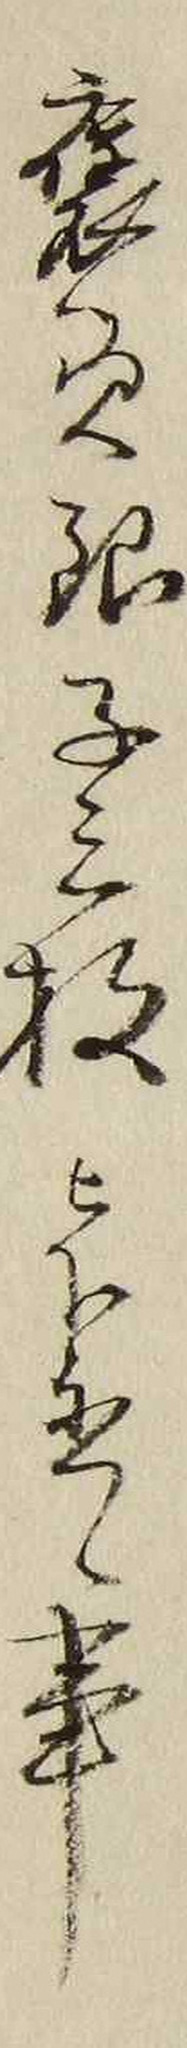褒美銀子三枚被下置候事
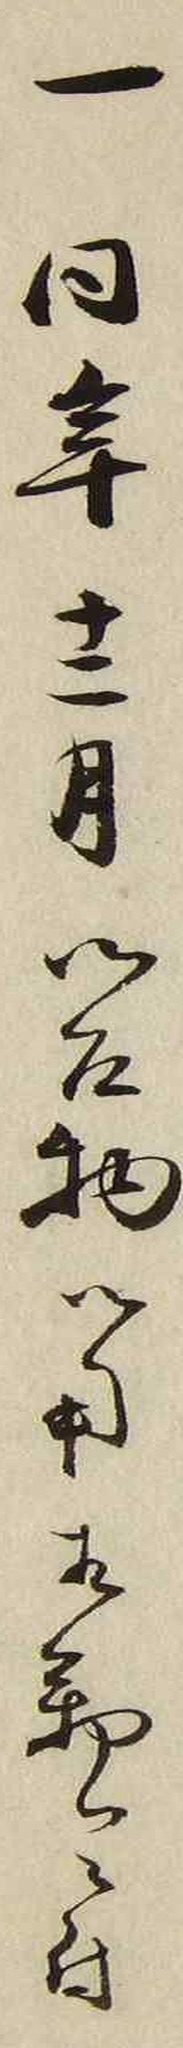一同年十二月御召物御用相勤候に付

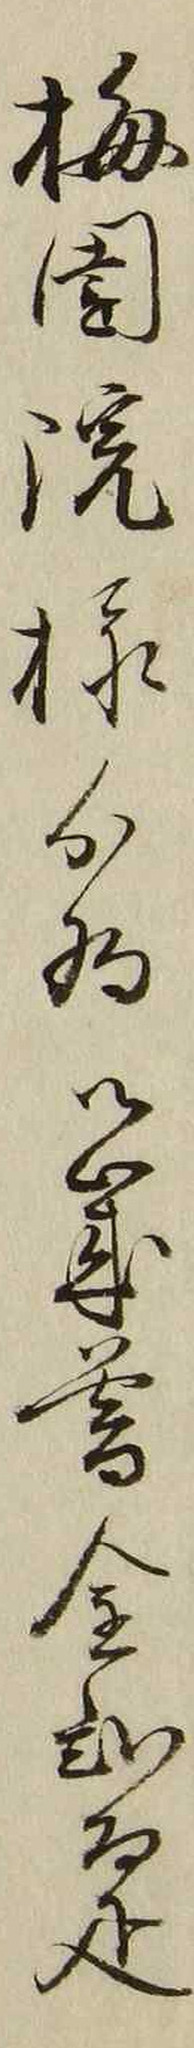梅園院様ゟ為御歳暮金弐百疋
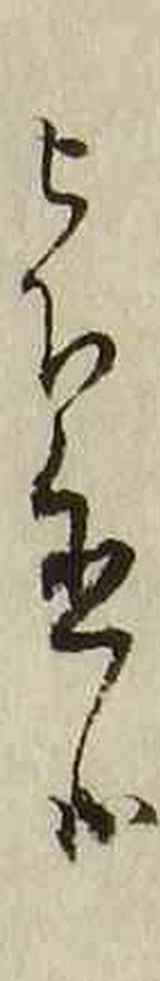被下置候
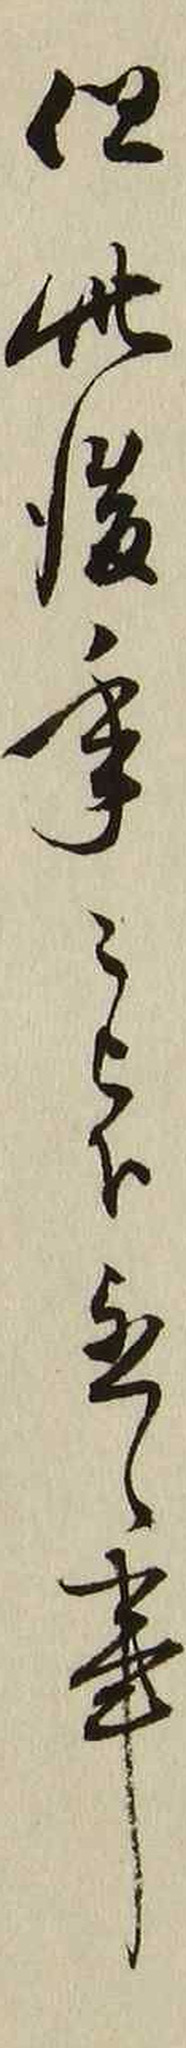但此後年々被下置候事
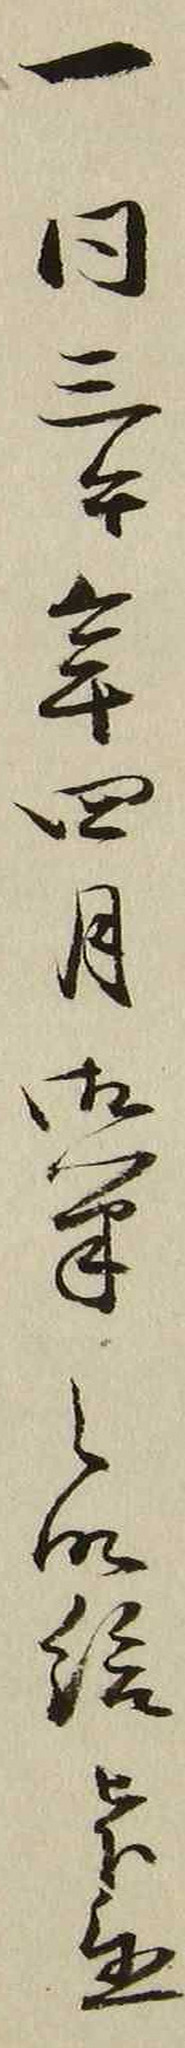一同三午年四月御筆之御絵被下置
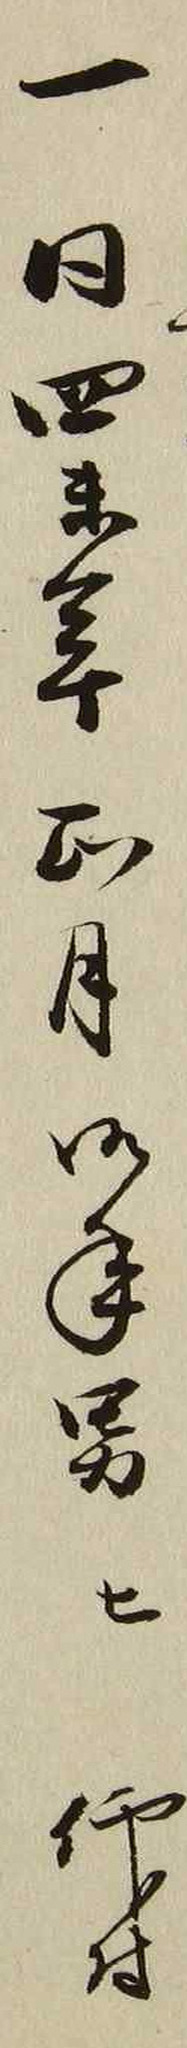一同四未年正月御年男被仰付
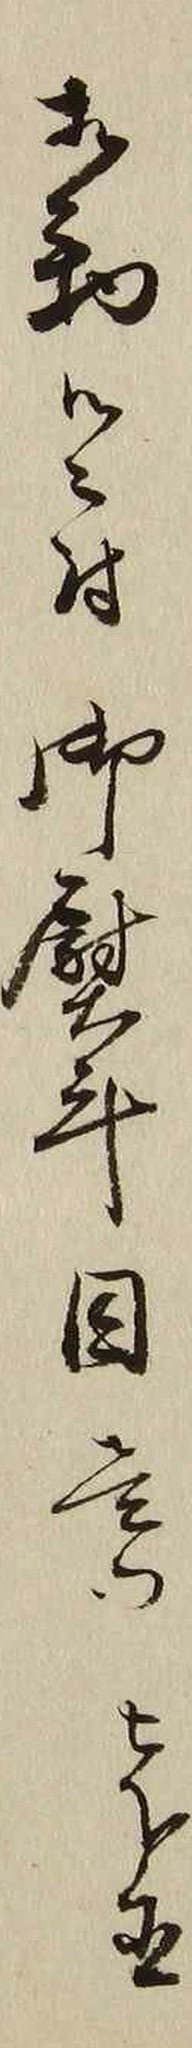相勤候に付御御熨斗目壱つ被下置
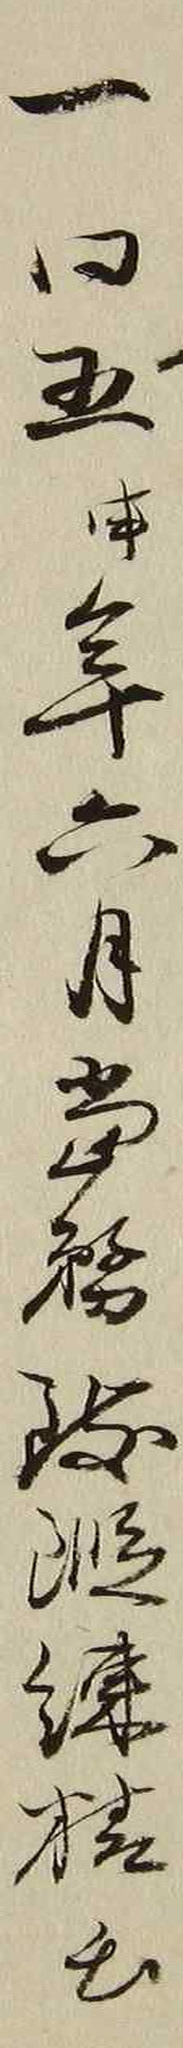一同五申年六月当務致鍛練精出
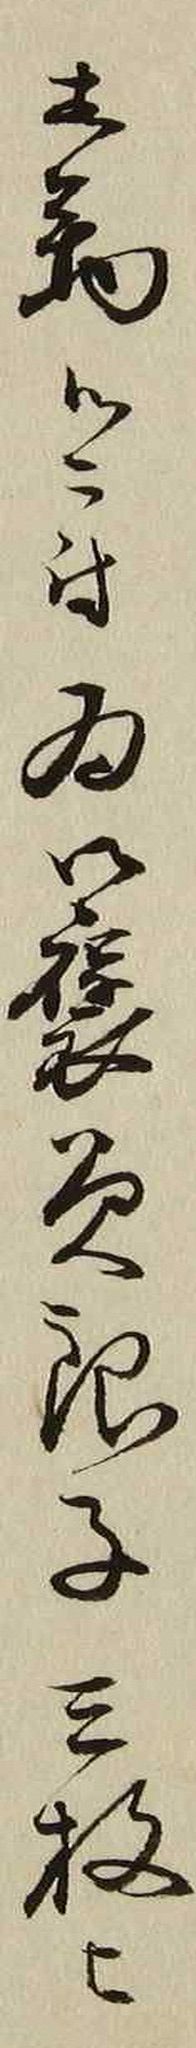相勤候に付為御褒美銀子三枚被
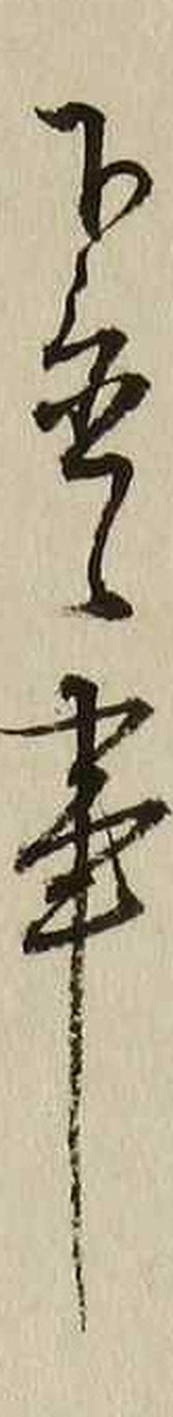下置候事
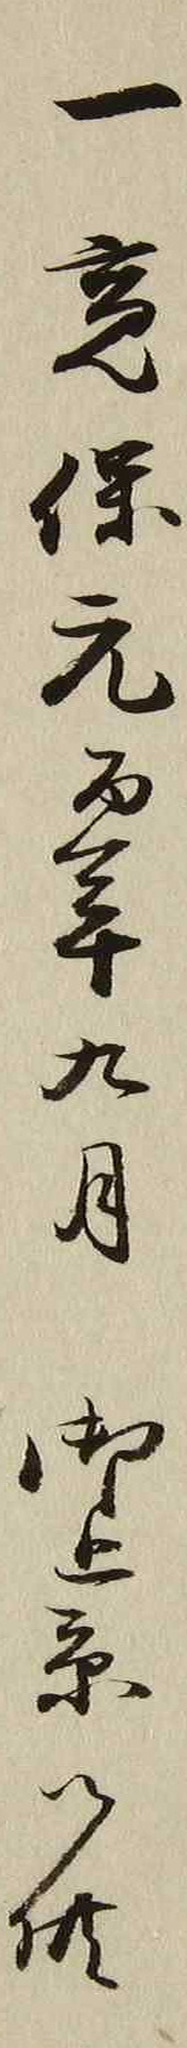一享保元酉年九月御上京御供
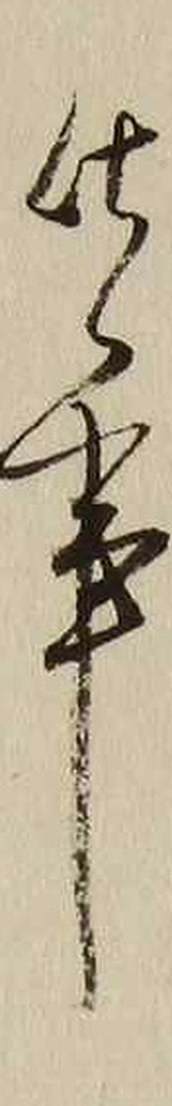仕候事
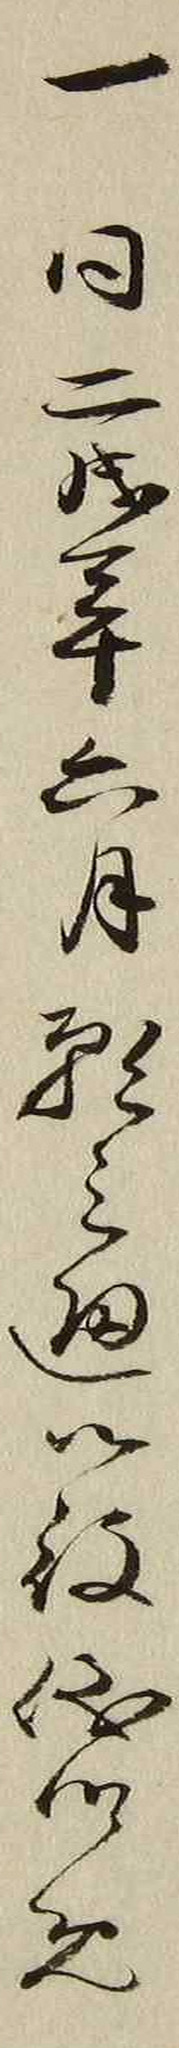一同二戌年六月願之通御役儀御免
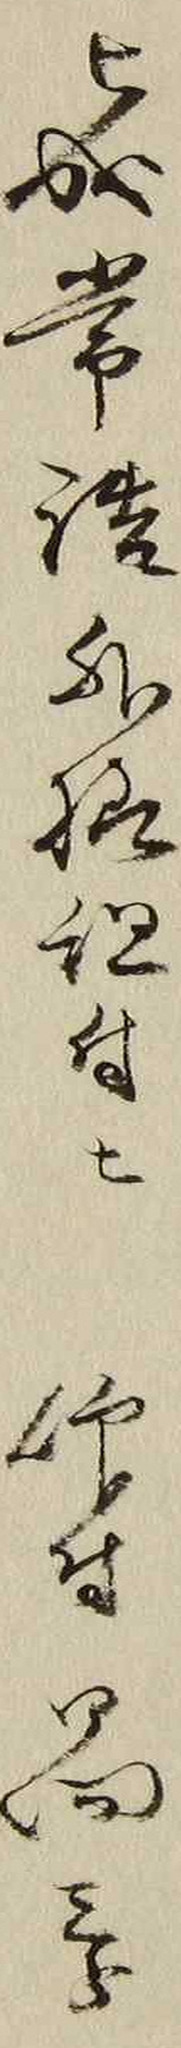被成常詰外様組付被仰付日向三郎
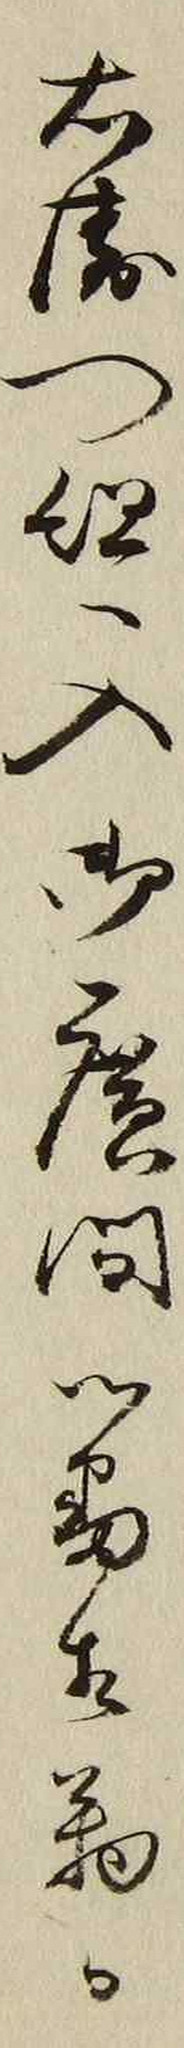右衛門組へ入御広間御番相勤候
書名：諸士系譜　巻之292　き之部1
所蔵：会津若松市立会津図書館
